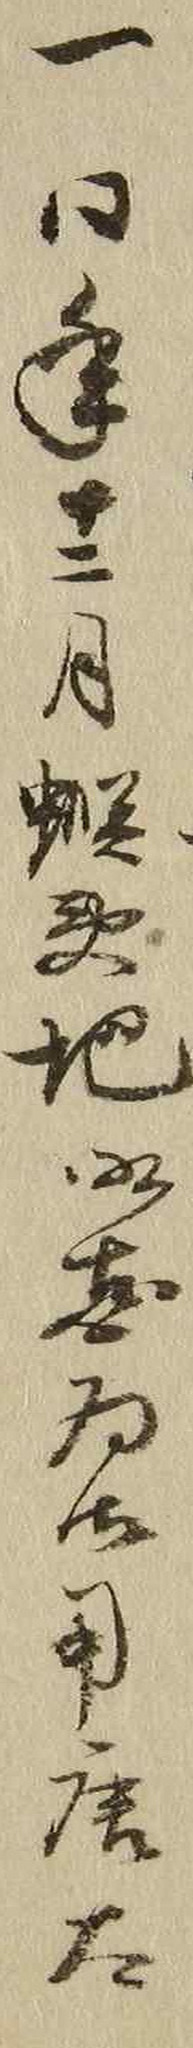一同年十二月蝦夷地御固為御用唐太
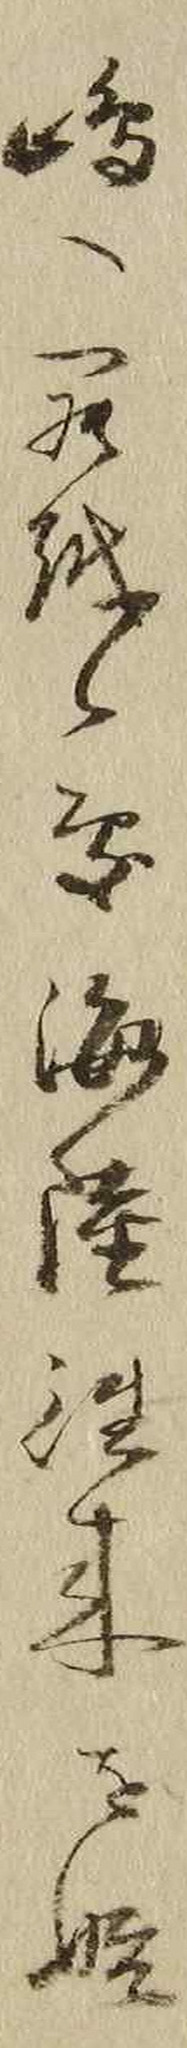島へ罷越候処海陸往来を始
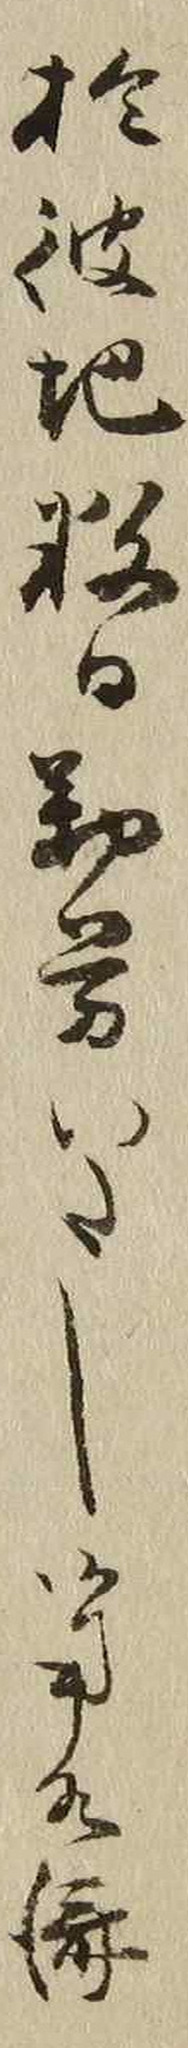於彼地数日勤労いたし御用相済
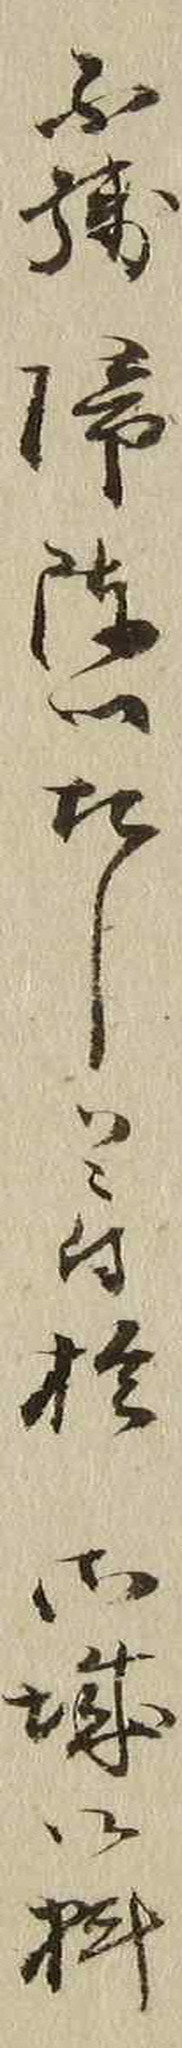不残帰陣いたし候ニ付於御城御料
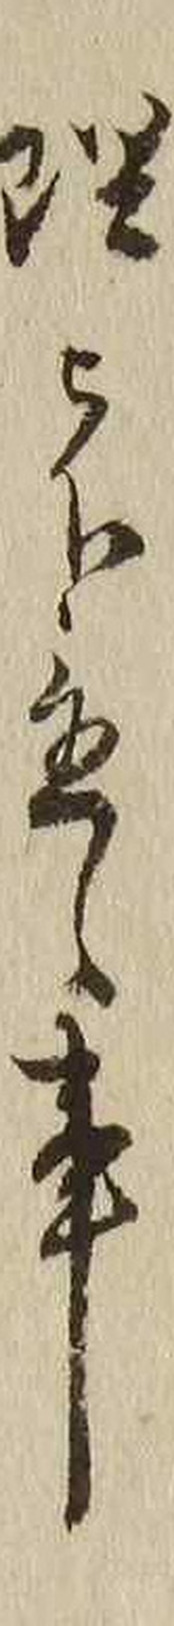理被下置候事
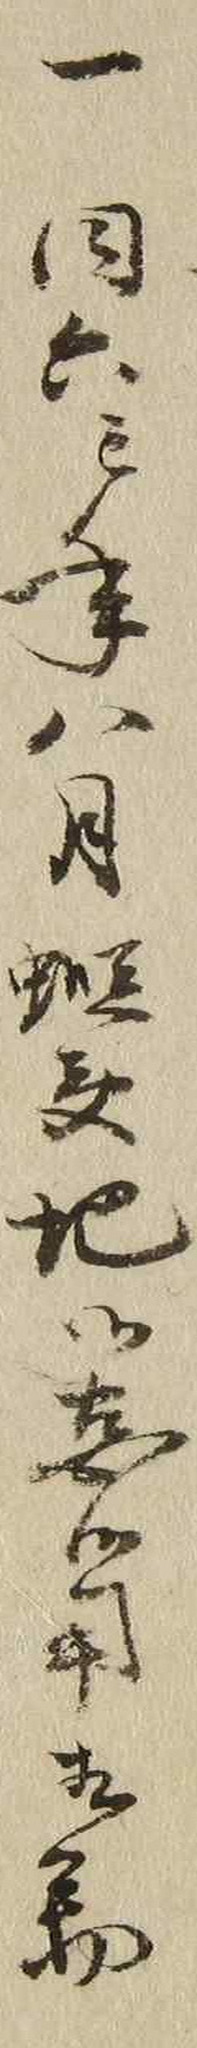一同六巳年八月蝦夷地御固御用相勤
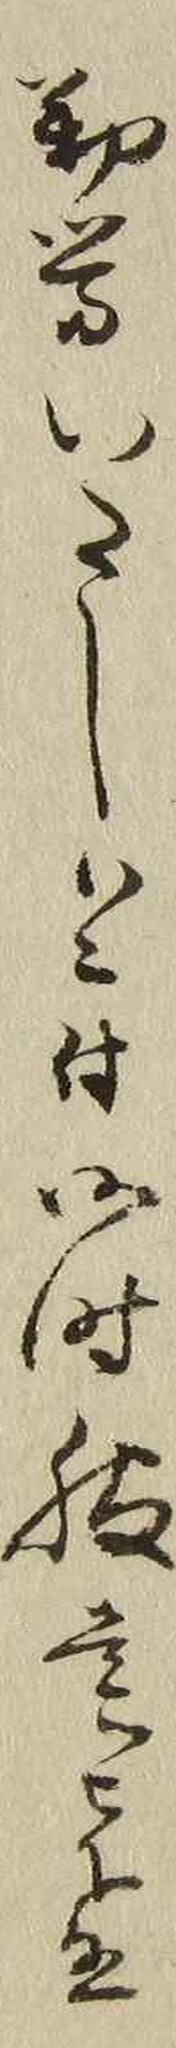勤労いたし候ニ付御時服壱ツ被下置
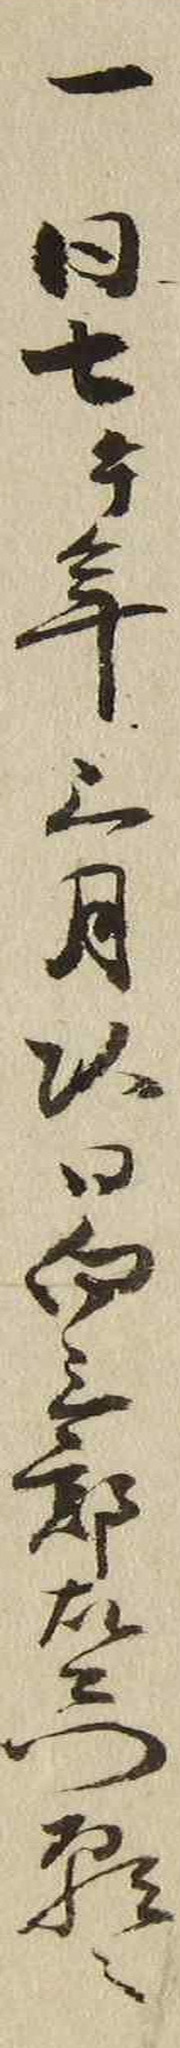一同七午年三月頭日向三郎左エ門願之
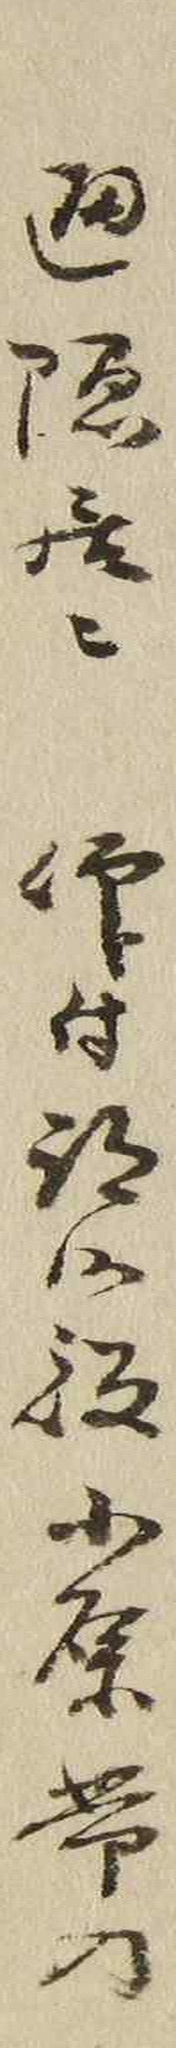通隠居被仰付跡御役小原帯刀
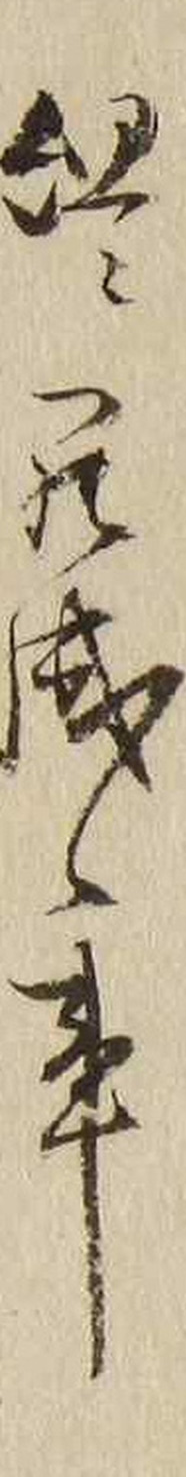組ニ罷成候事
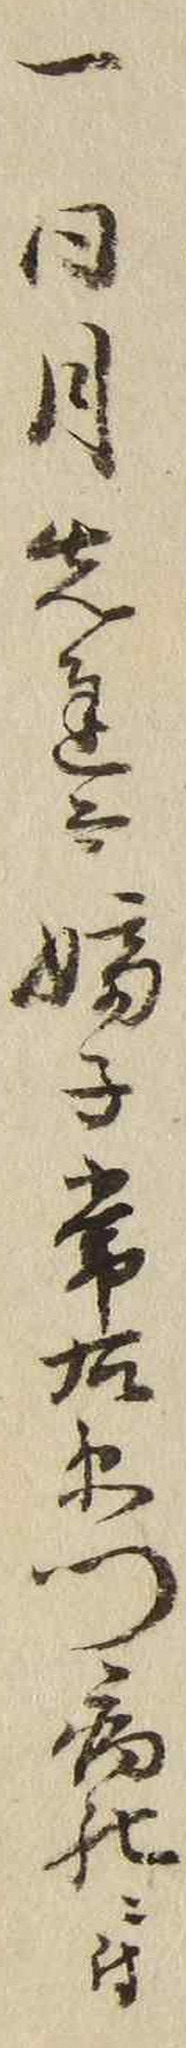一同月先達而嫡子常右衛門病死ニ付

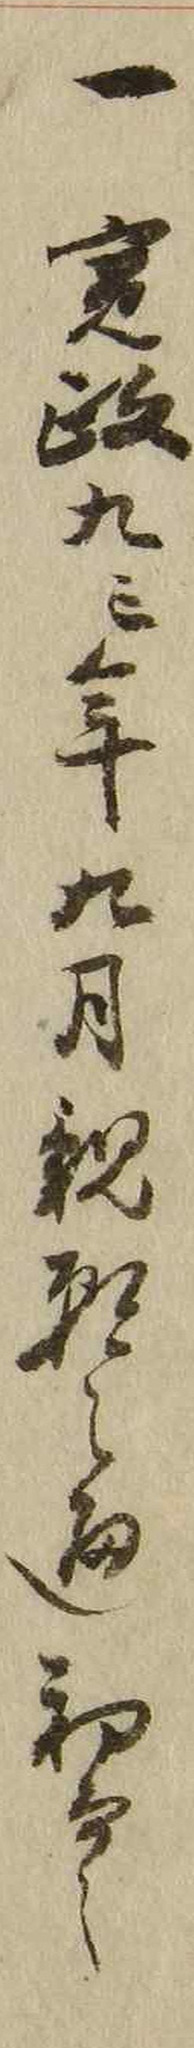一寛政九巳年九月親願之初而之
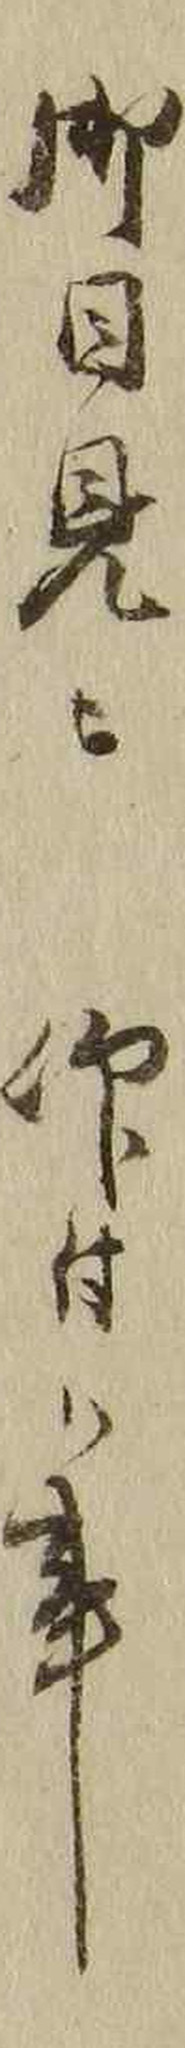御目見被仰付候事
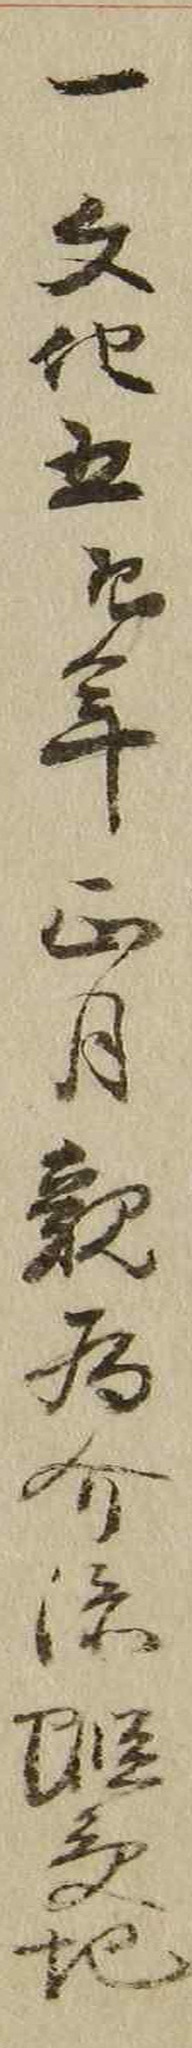一文化五辰年正月親為介添蝦夷地
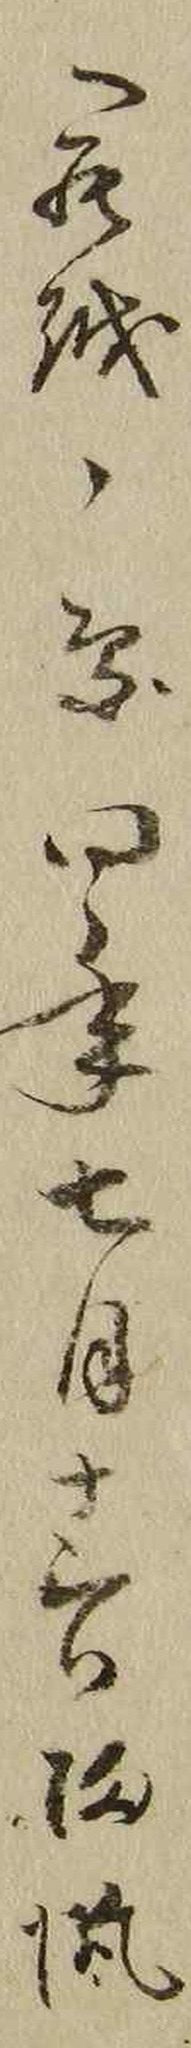へ罷越候処同年七月十三日帰帆
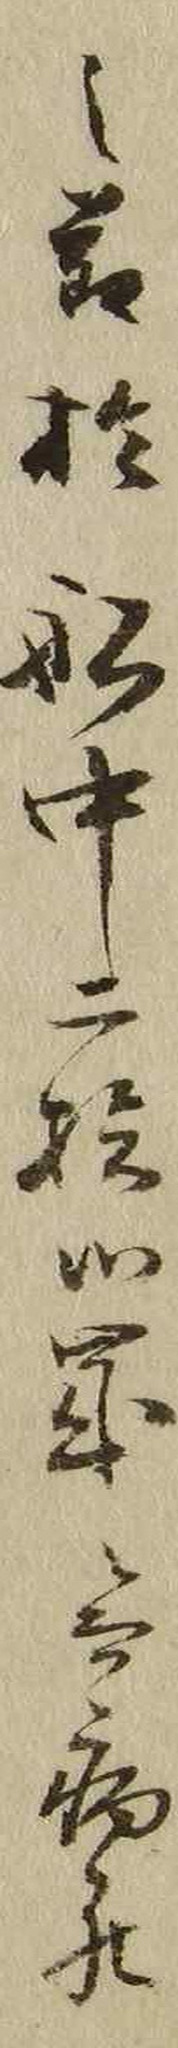之節於船中二拾弐歳ニ而病死
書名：諸士系譜　巻之232　け之部1
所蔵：会津若松市立会津図書館
